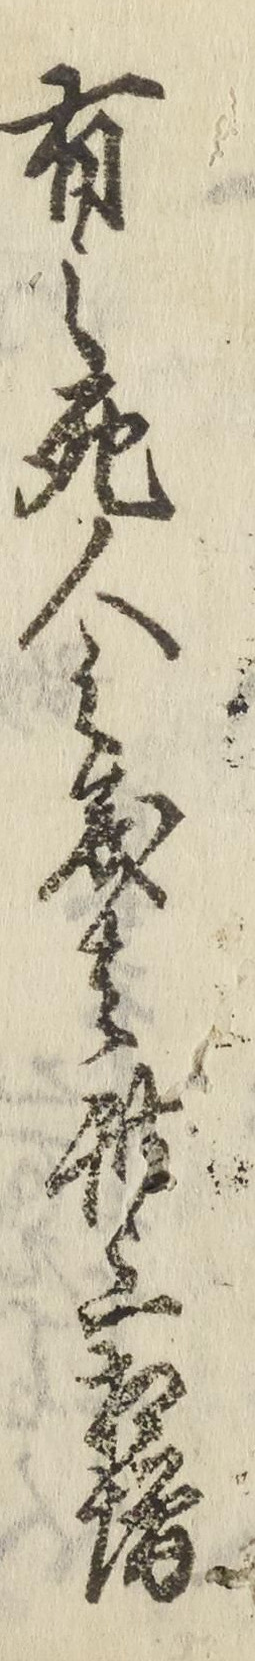有之死人之義は此上相増
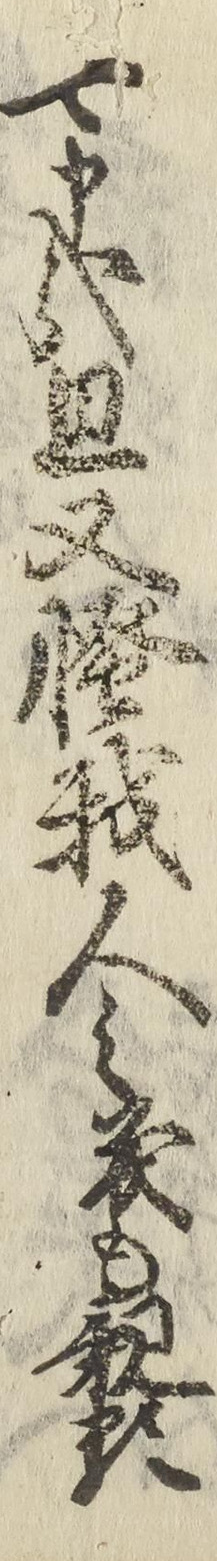可申哉且又怪我人之義も親類
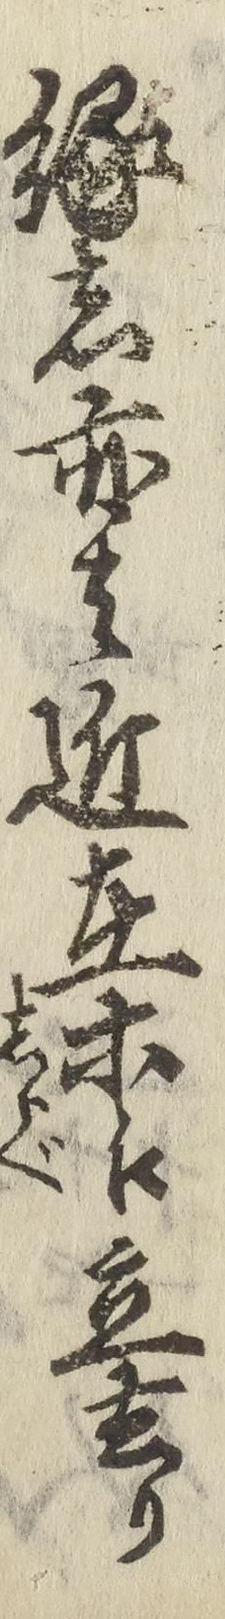縁者亦は近在等江立去り
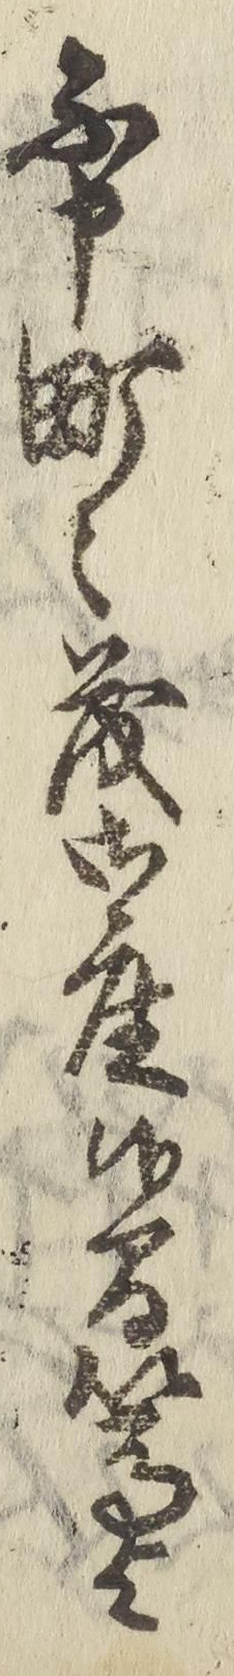不申町々も御座候間篤与
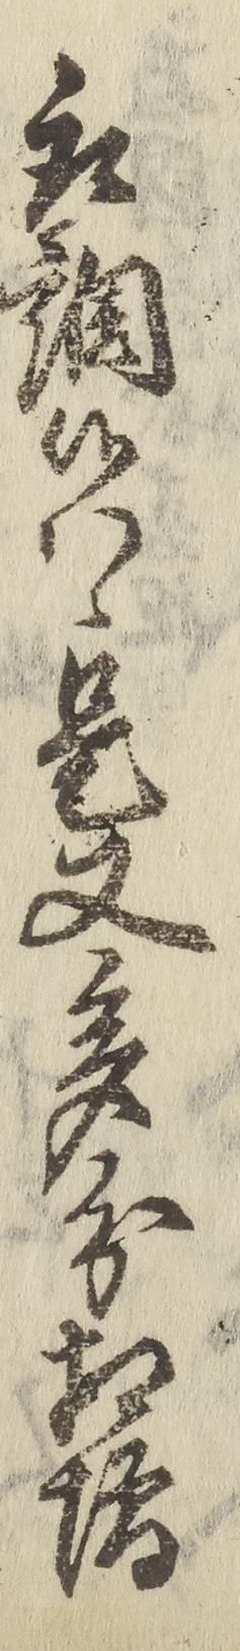取調候はゝ是又多分相増
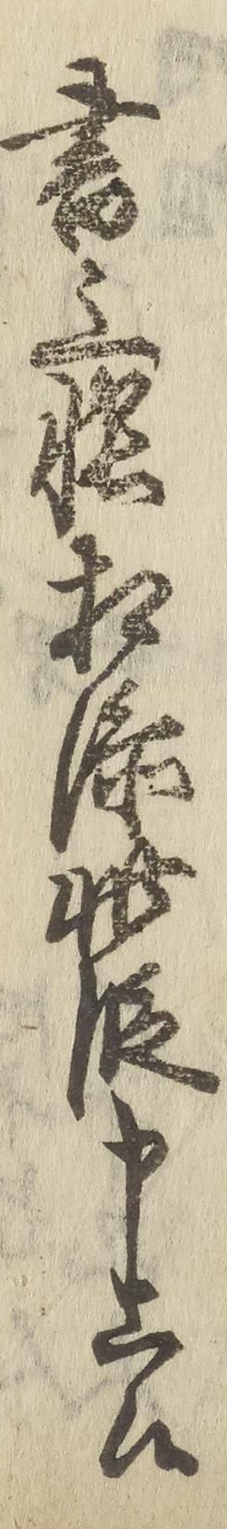書上帳相添此段申上候
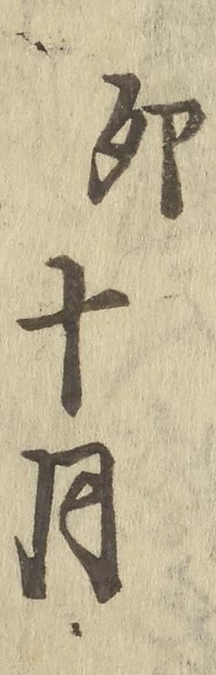卯十月

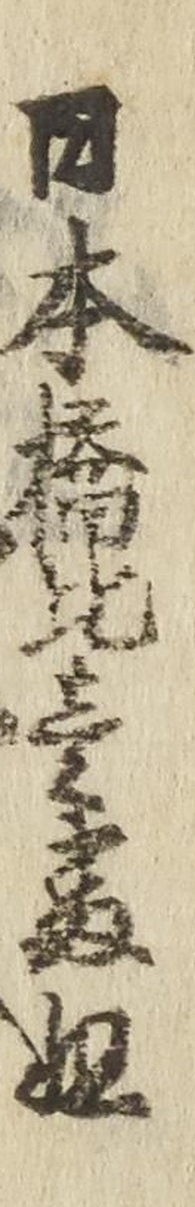日本橋北壱番組
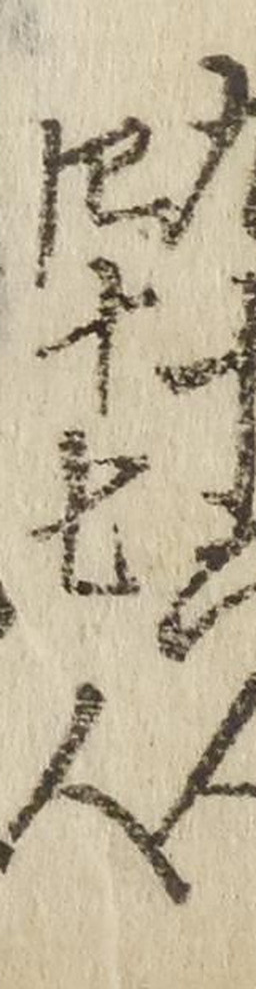女十七人
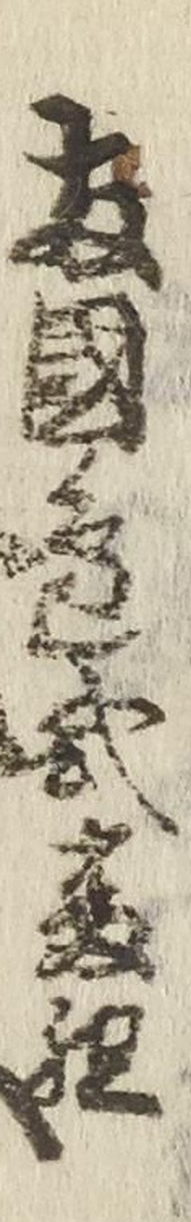両国辺弐番組
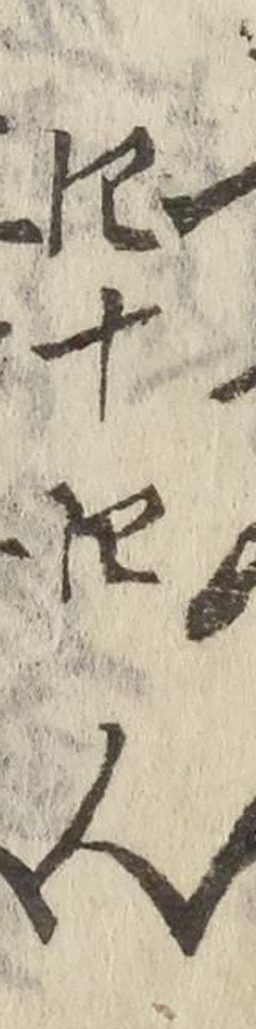内男四十四人
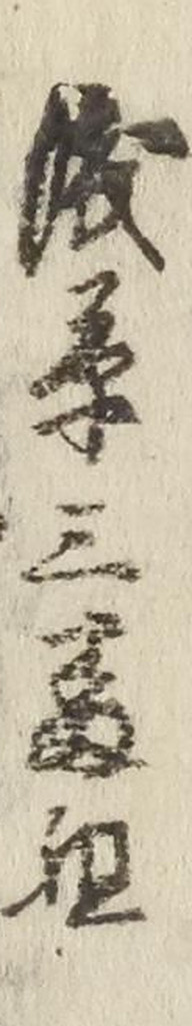浅草三番組
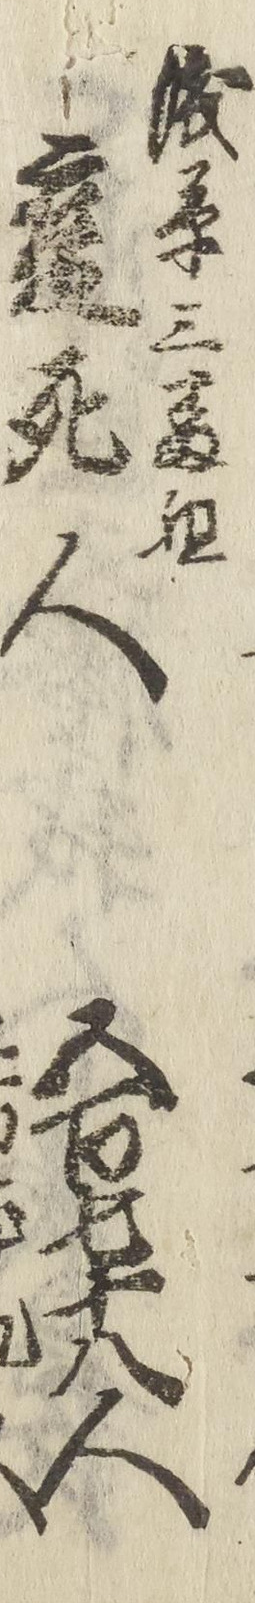変死人五百七十八人
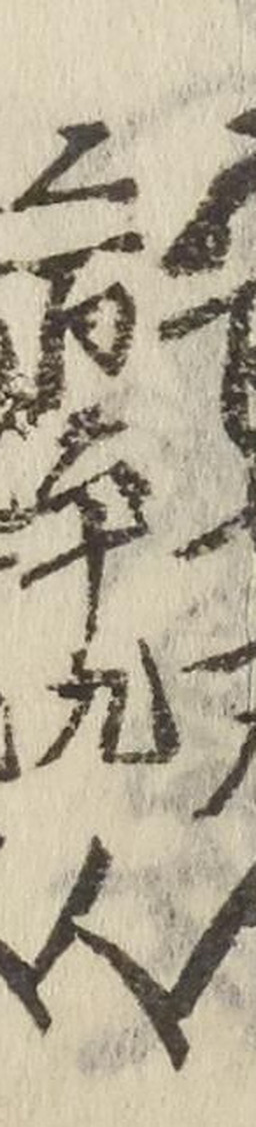内男二百六十九人
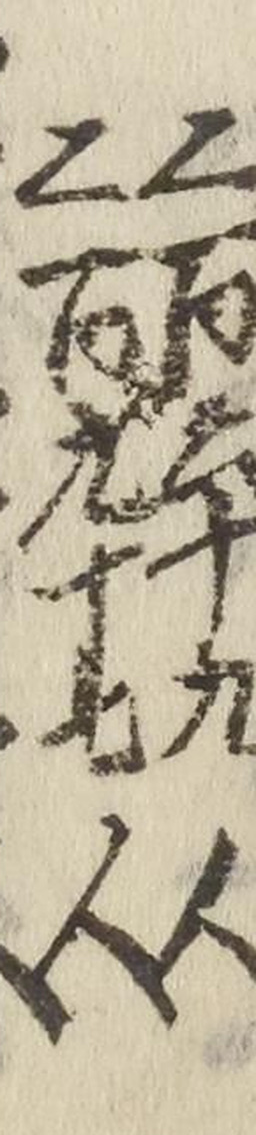女二百九十七人
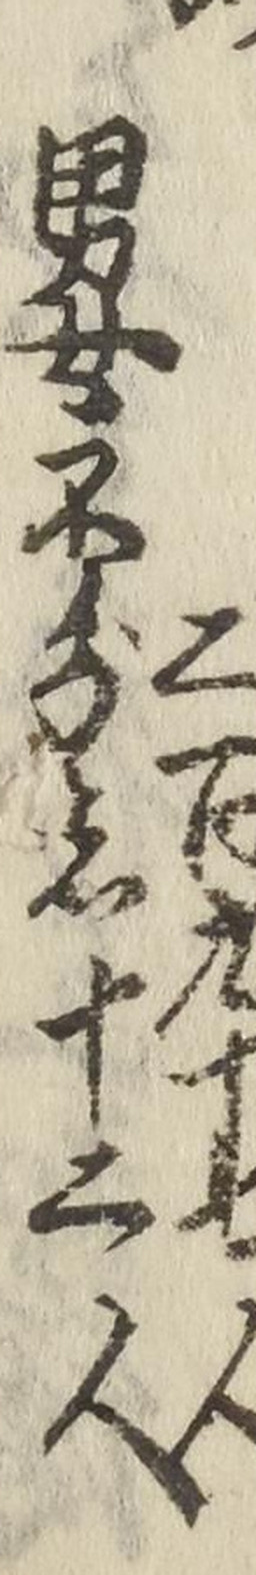男女不分者十二人
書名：地震出火　男女死人怪我人書上之寫
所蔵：東京大学地震研究所図書室 Earthquake Research Institute Library, The University of Tokyo, JAPAN
